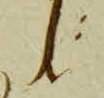1:
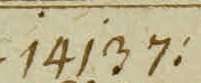14137
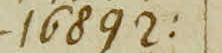16892:
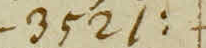3521:
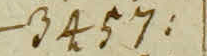3457:
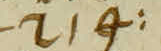219
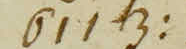6113
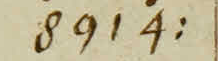8914:
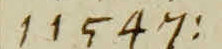11547
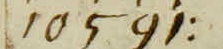10591:
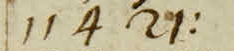11421:
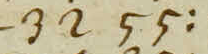3255
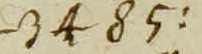3485
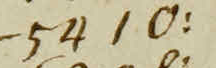5410
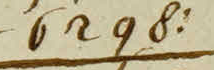6298:
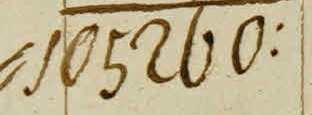105260:
